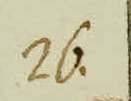26.
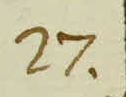27.
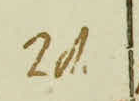28
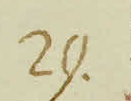29.
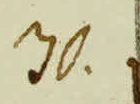30.
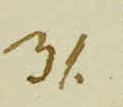31.
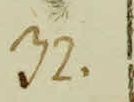32.
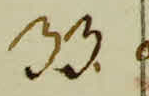33.
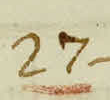27
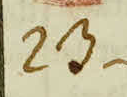23
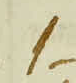1
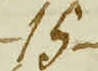15
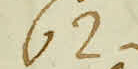62
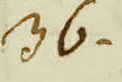36
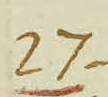27
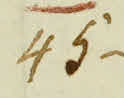45
